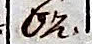62.
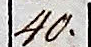40.
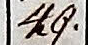49.
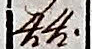44.
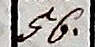56.
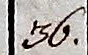36.
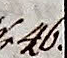46.
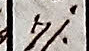71.
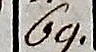69.
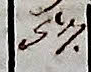57.
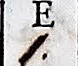1.
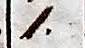1.
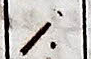1.
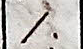1.
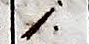1.
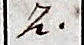2.
